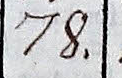78.
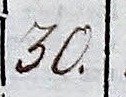30.
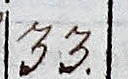33.
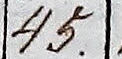45.
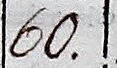60.
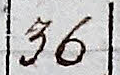36
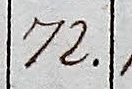72.
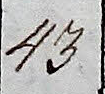43
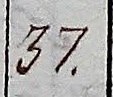37.
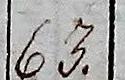63.
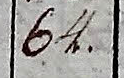64.
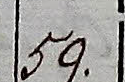59.
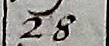28
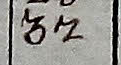32
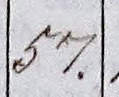57.
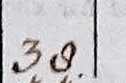38.
